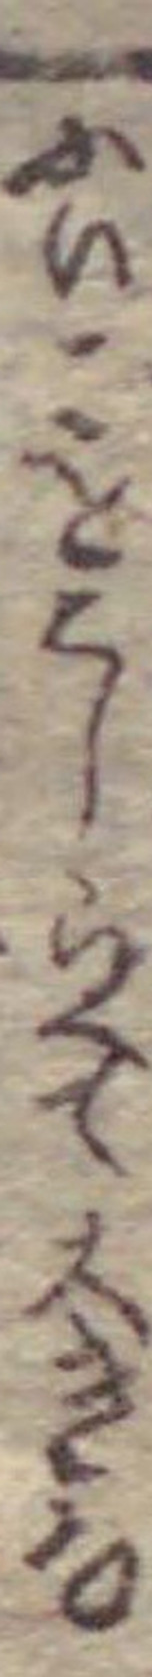ふいごをこしらへて大きな
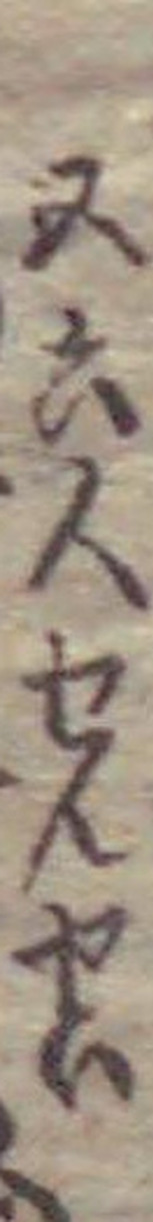五六人せんせい
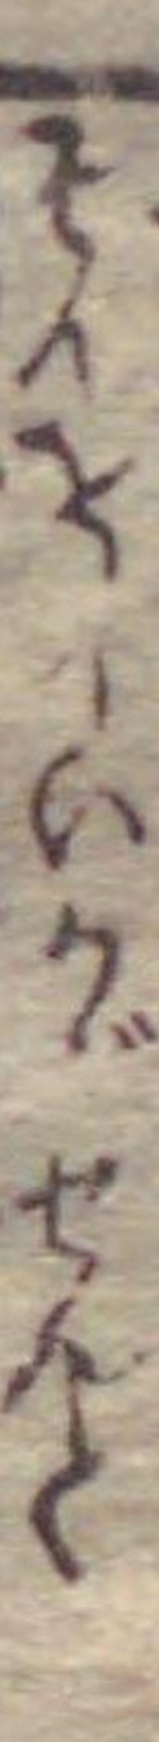そんをしいかゞせんと
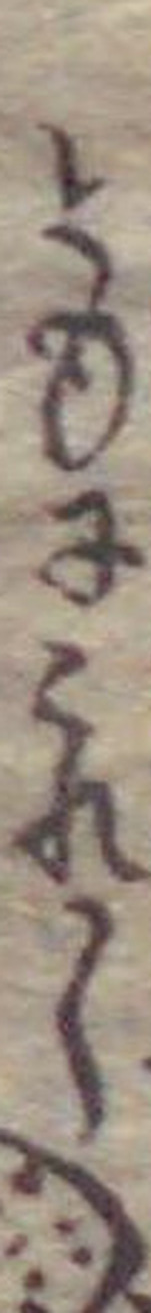ともにこれ〳〵
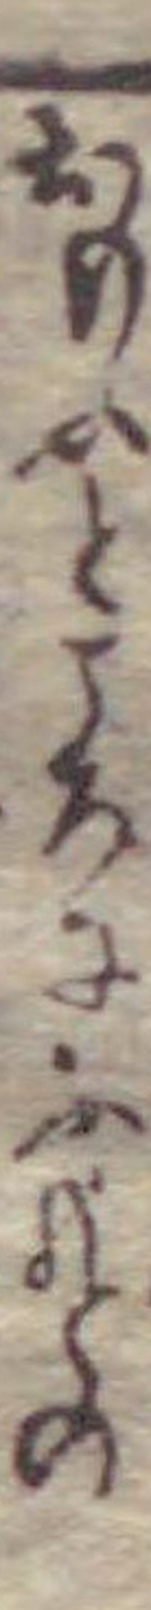おもふところにふもとの
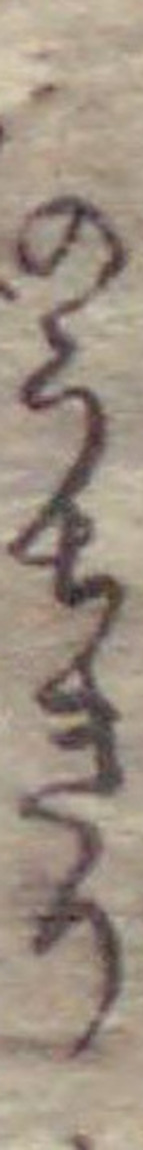のうちきり
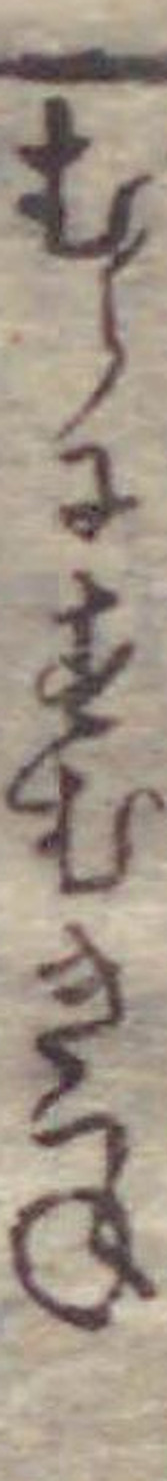むらにすむきつね
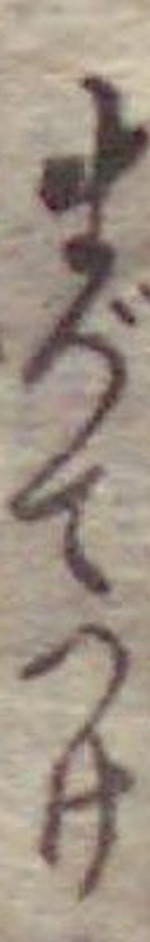まづてつけ
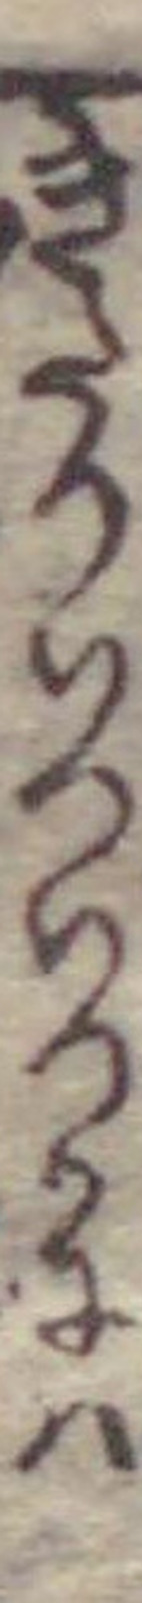きたりいついつかには
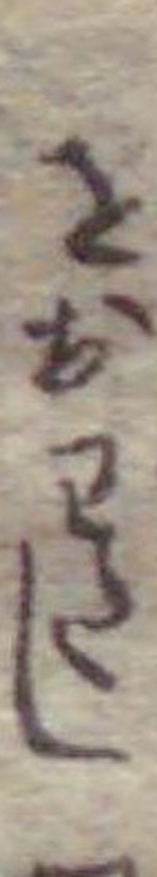をおわたし
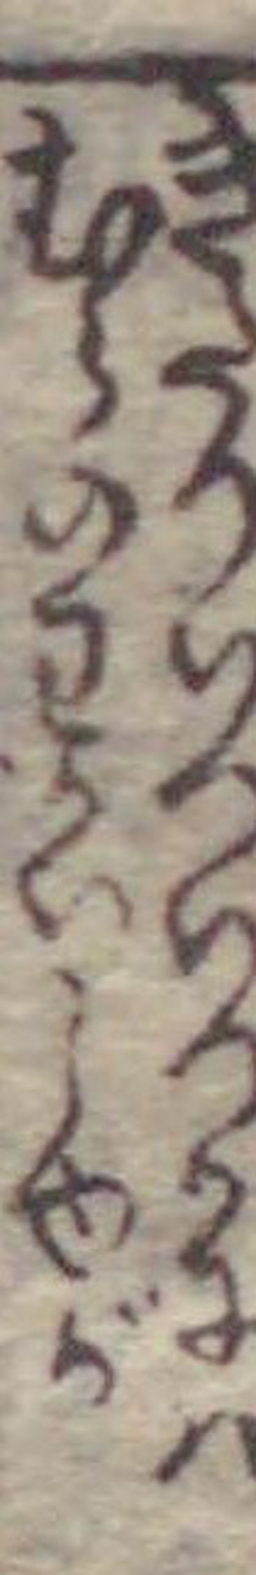むらのわかいしゆが
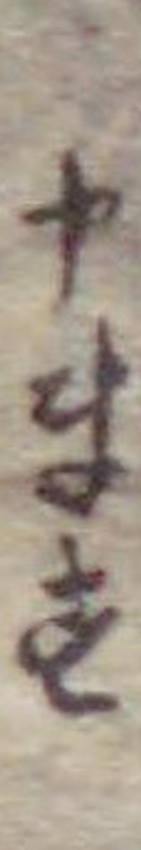申ます
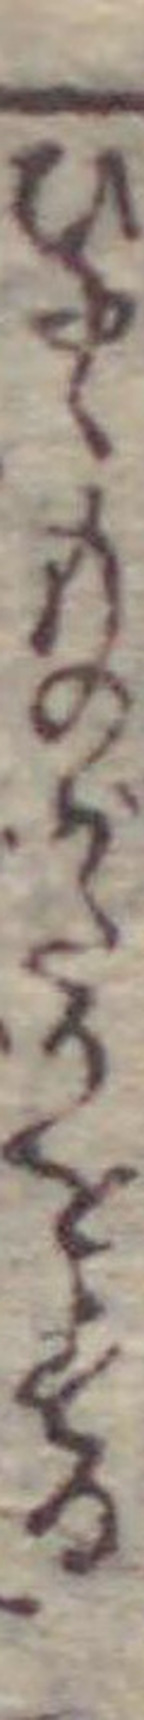ひやくものがたりをする
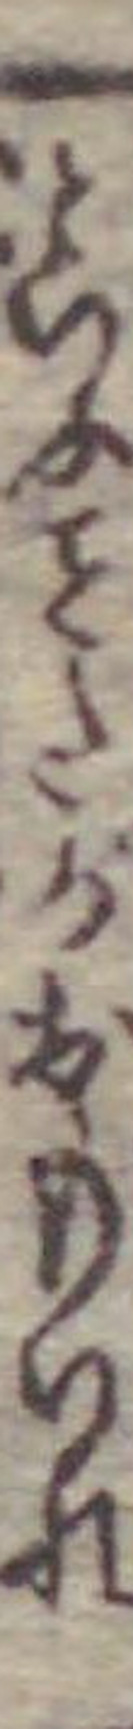といふことたがおもいれ
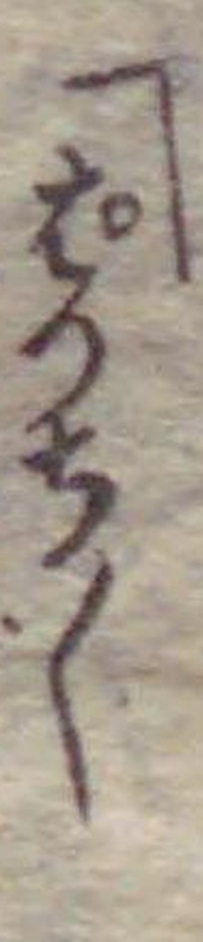〽ぱつち〳〵
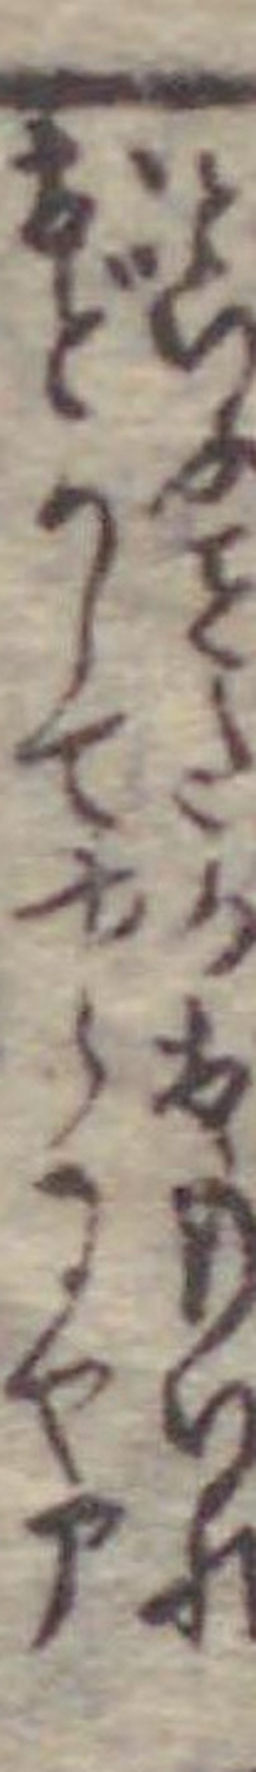おどかしてやらにやァ
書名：化物見世開 : 2巻
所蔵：国立国会図書館 National Diet Library, JAPAN
